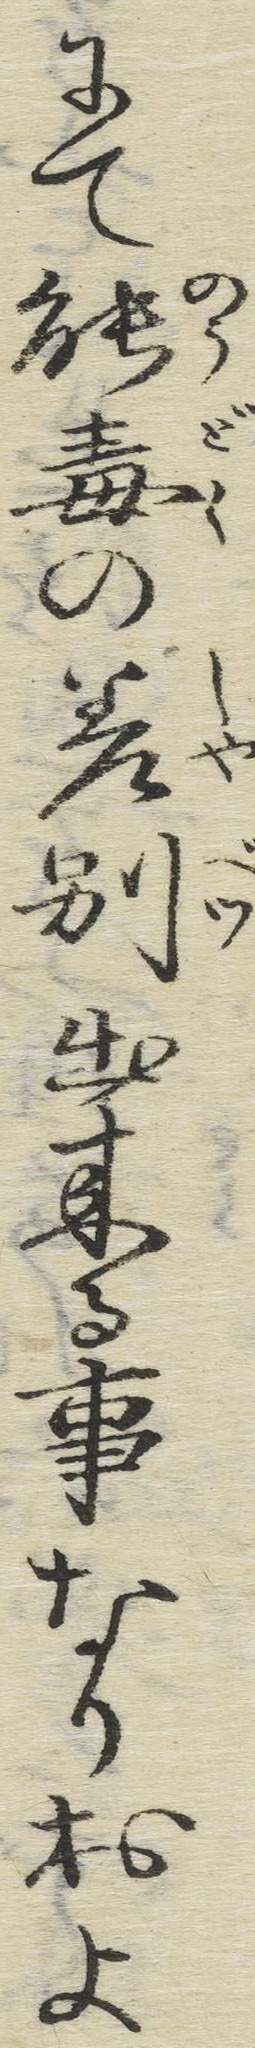にて能毒の差別出来る事なりおよ
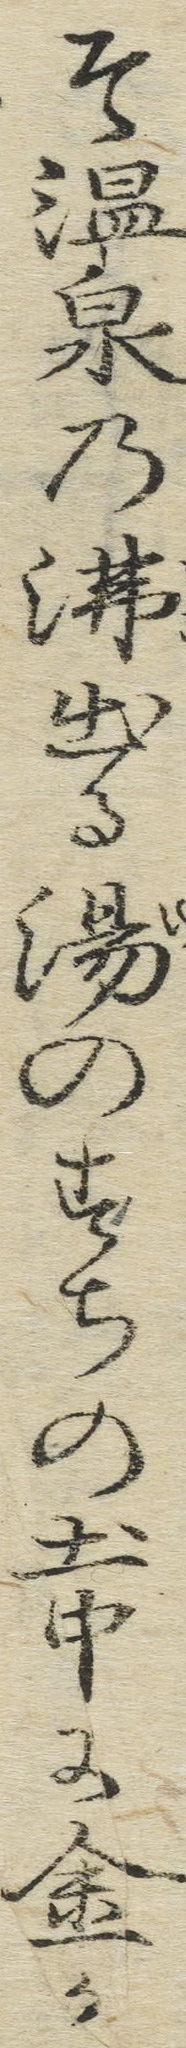そ温泉の沸出る湯のすちの土中に金ゝ
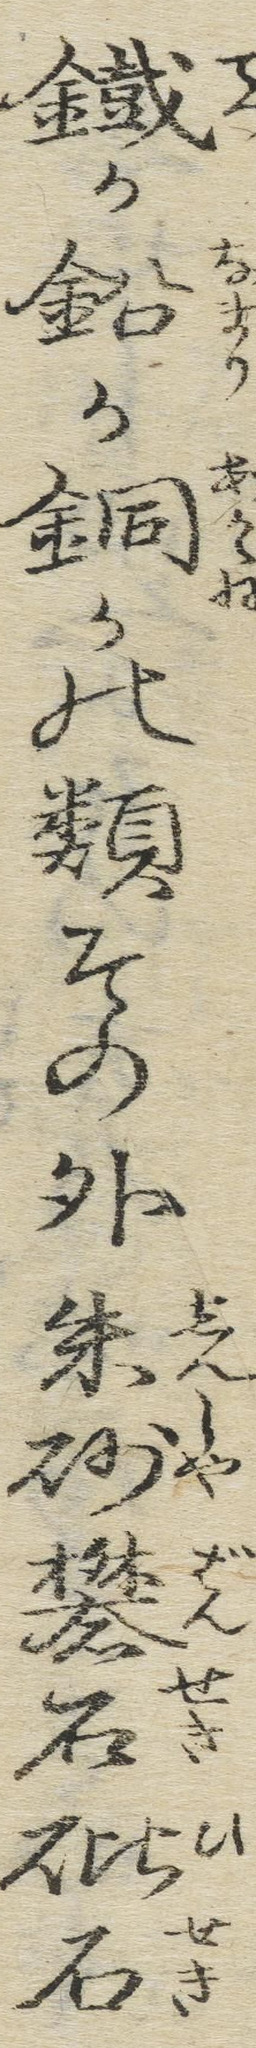鐵ゝ鉛ゝ銅ゝの類その外朱砂礬石砒石
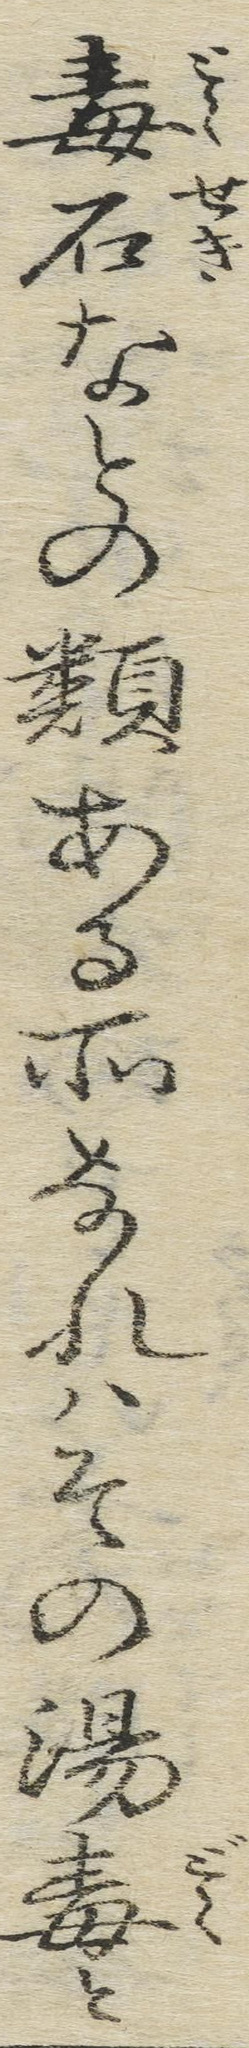毒石なとの類ある所なれはその湯毒と
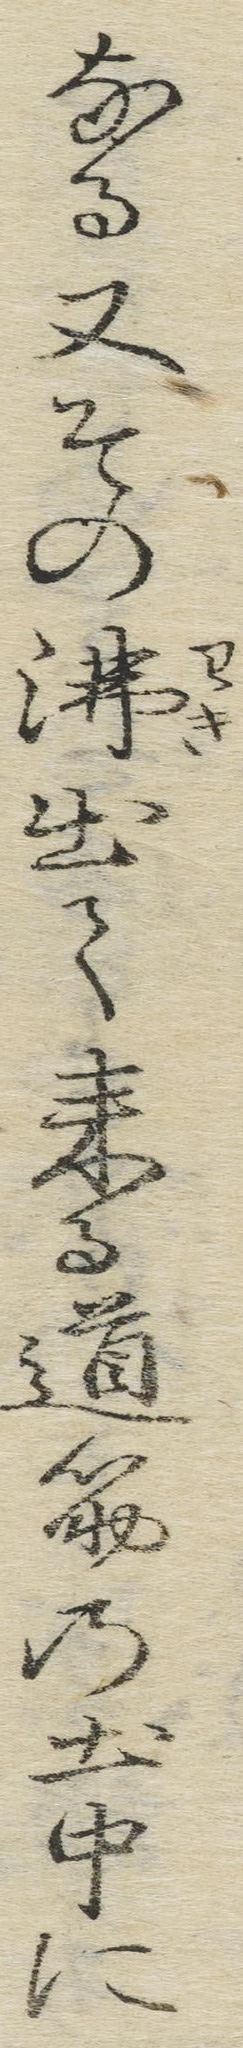なる又その沸出て来る道筋の土中に
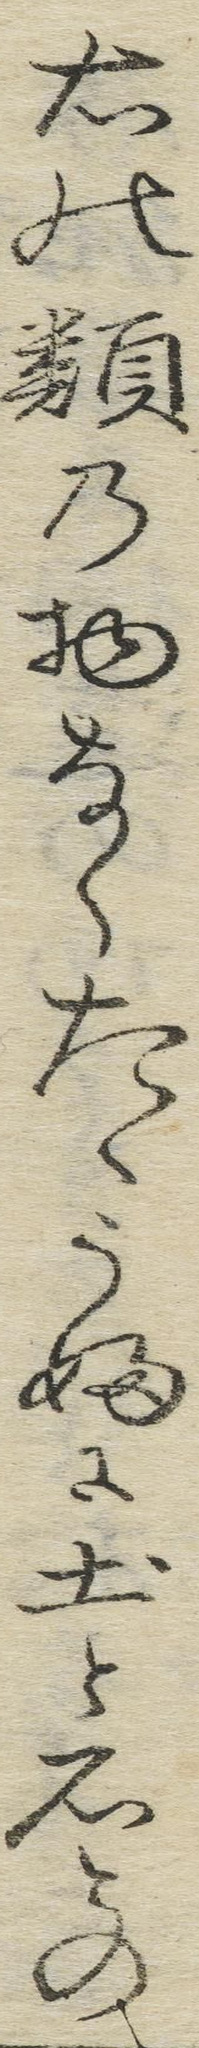右の類の物なくたゝうふに土と石との
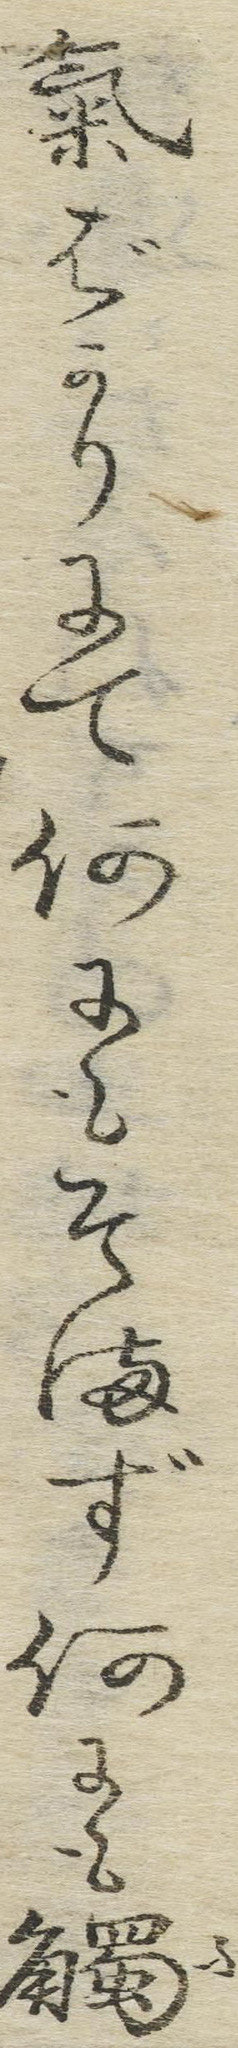気ばかりにて何にもそまず何にも触
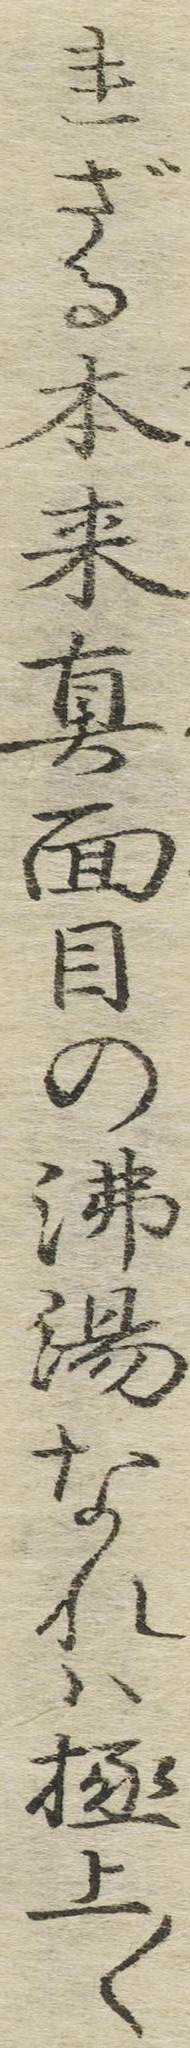れざる本来真面目の沸湯なれは極上〳〵
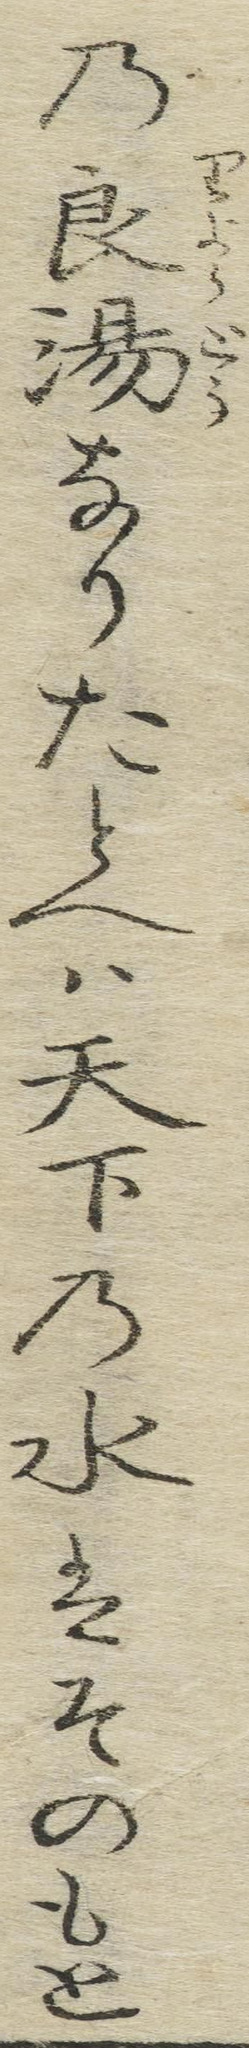の良湯なりたとえは天下の水はそのもと

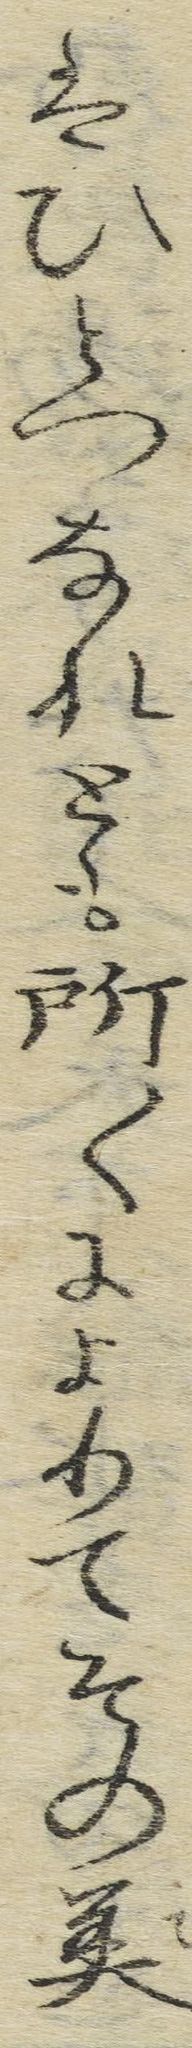はひとつなれども所〳〵によりてその美
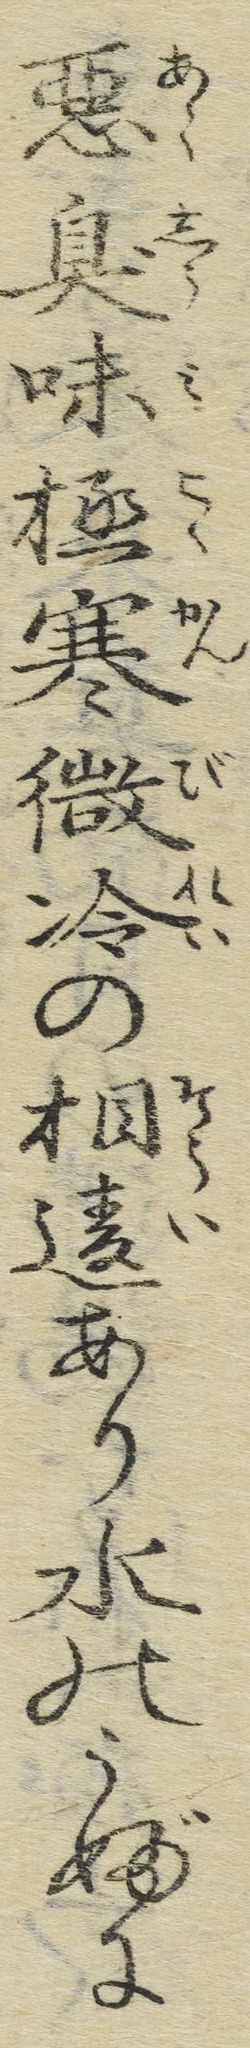悪臭味極寒微冷の相違あり水のうぶに
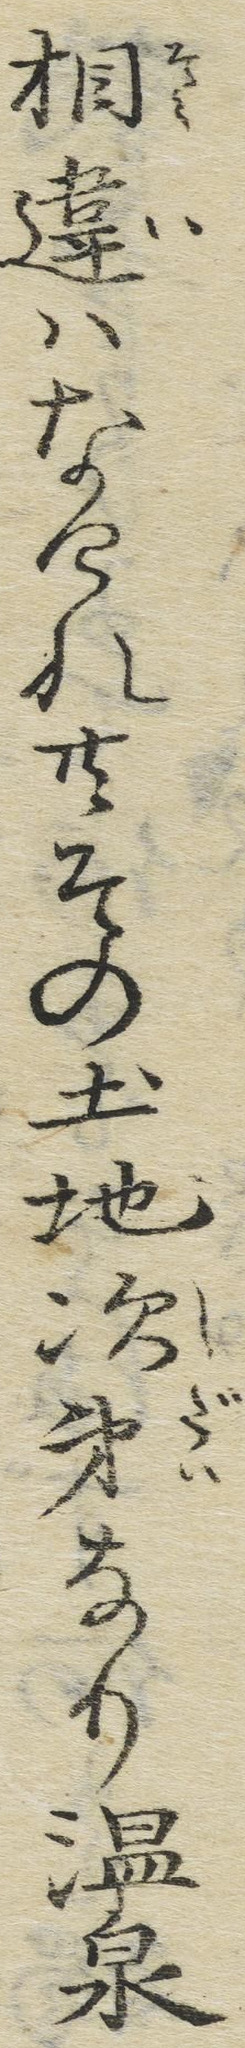相違はなけれ共その土地次第なり温泉
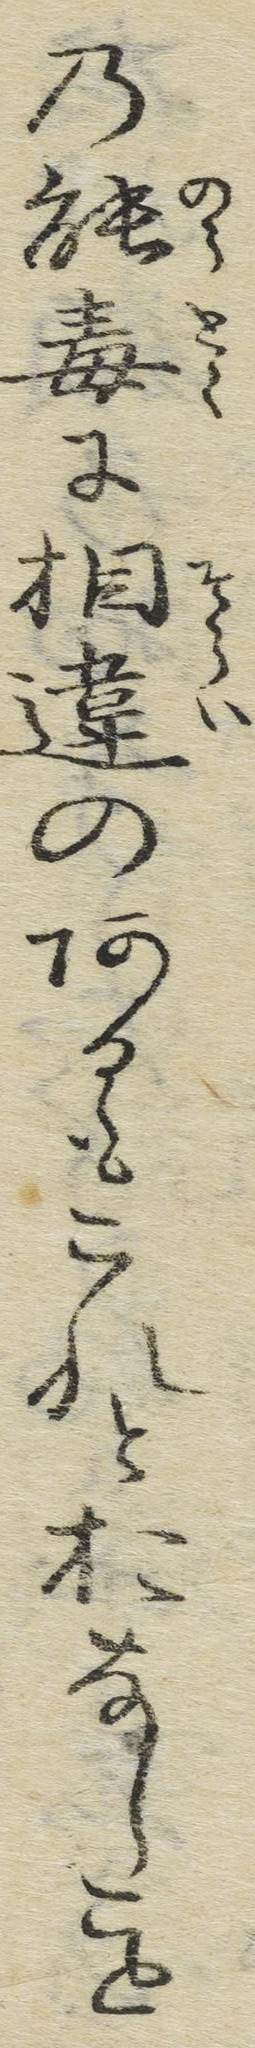の能毒に相違のあるもかれとおなしこと
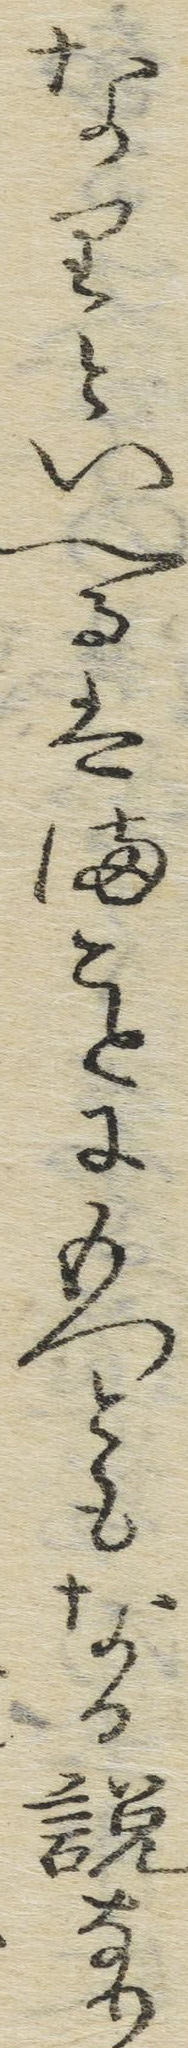なりといへるはまことにもつともなる説なり
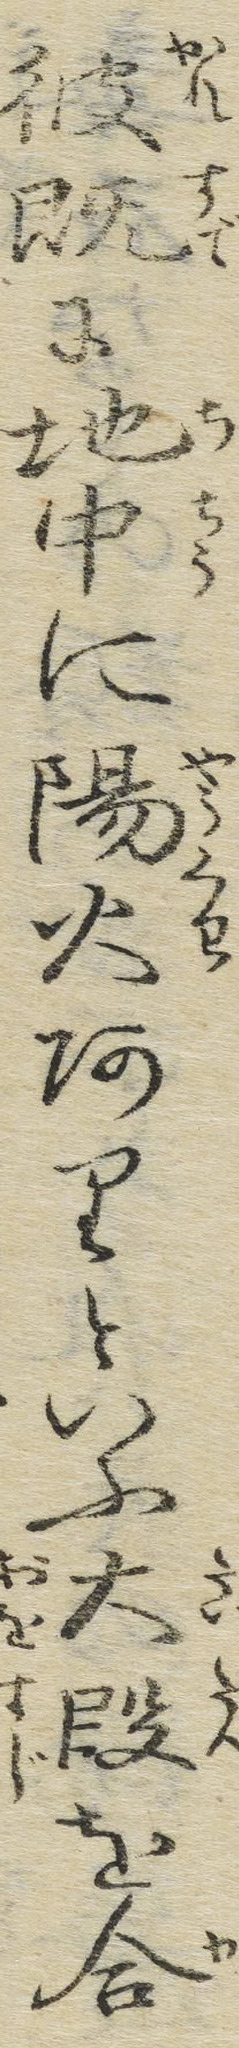彼既に地中に陽火ありという大段を合
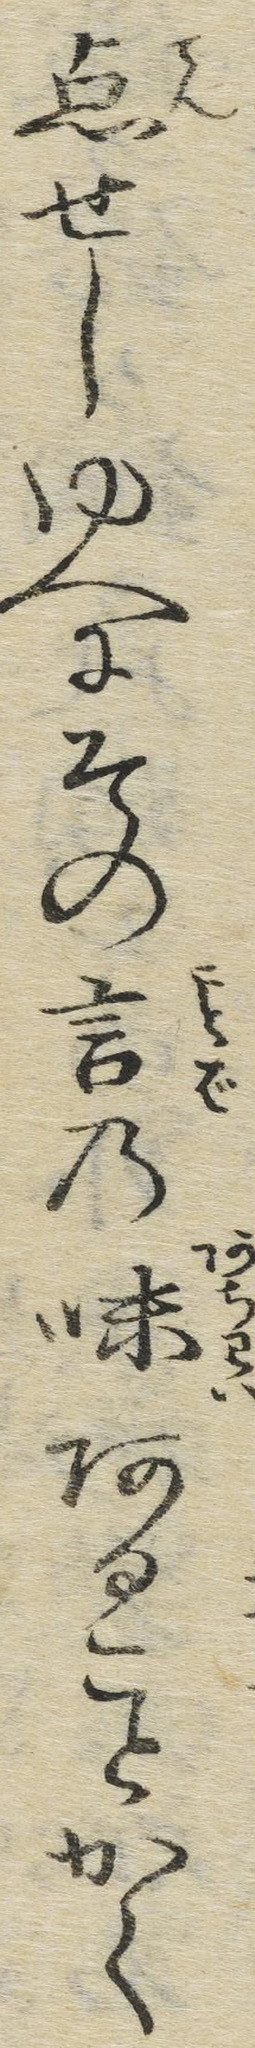点せしゆへるその言の味あることかく
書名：温泉考
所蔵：東京大学地震研究所図書室 Earthquake Research Institute Library, The University of Tokyo, JAPAN
